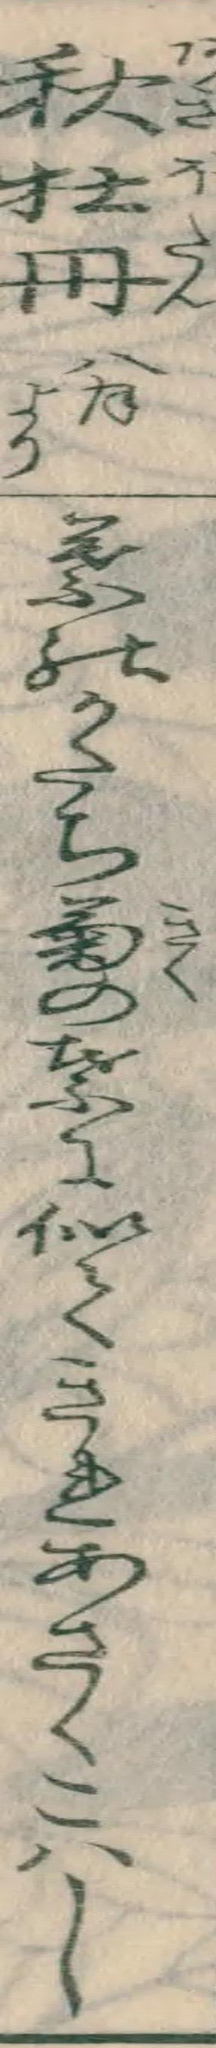葉のかたち菊の葉に似てきれあさくこはし
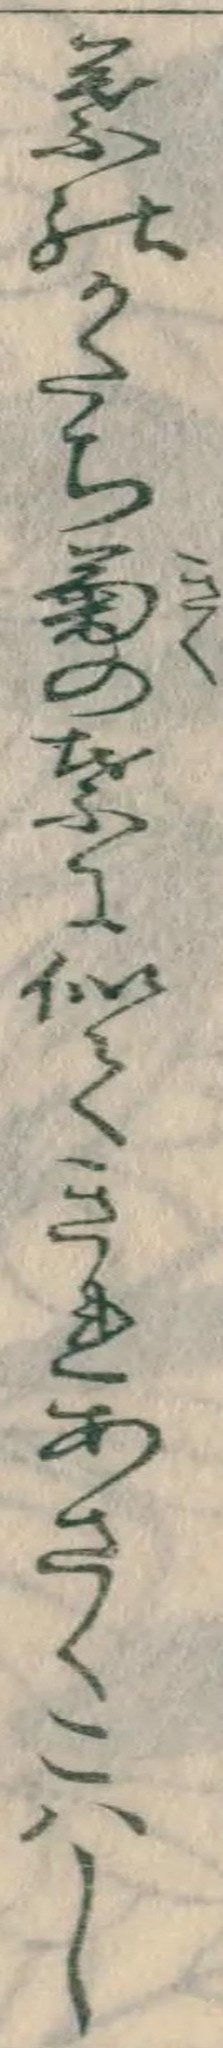葉のかたち菊の葉に似てきれあさくこはし
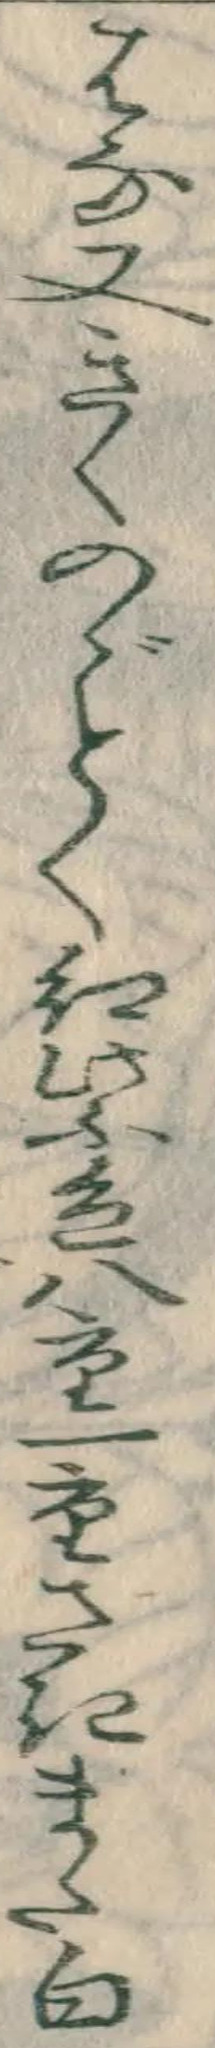はな又きくのごとく紅紫色八重一重さきまた白
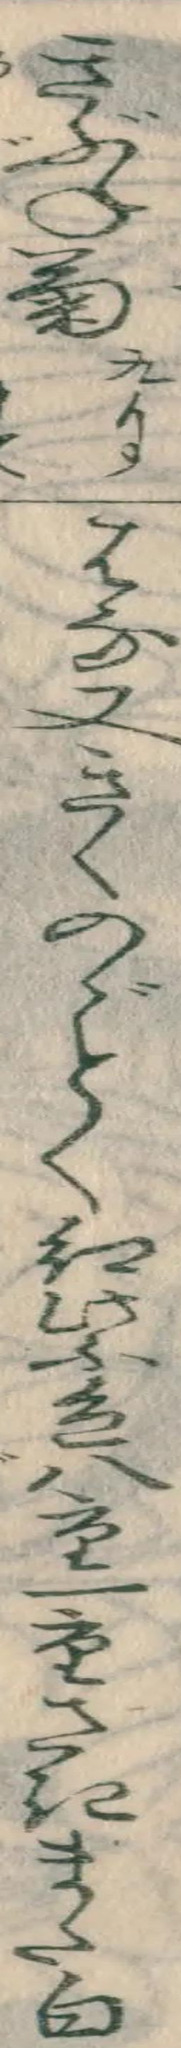はな又きくのごとく紅紫色八重一重さきまた白
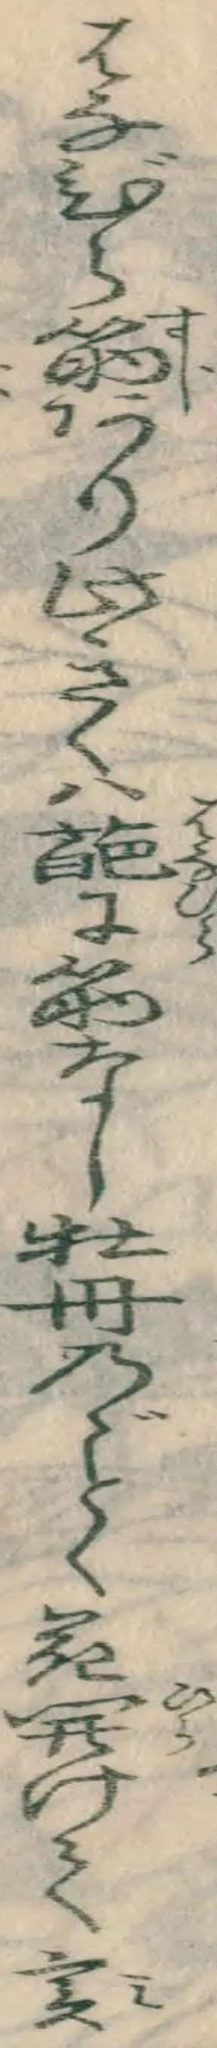はなびら筋あり此きくは葩に筋なし牡丹のごとく花開けて実
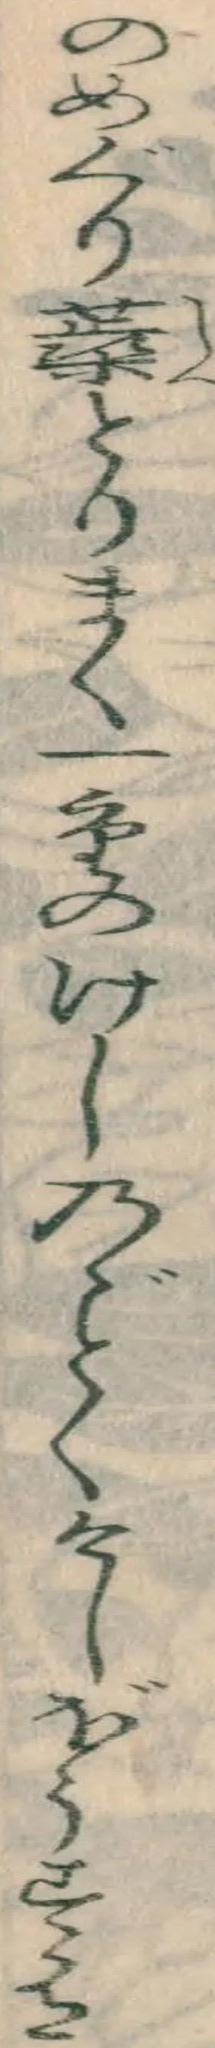のめぐり蕊とりまく一重のけしのごとくけしぼうす有

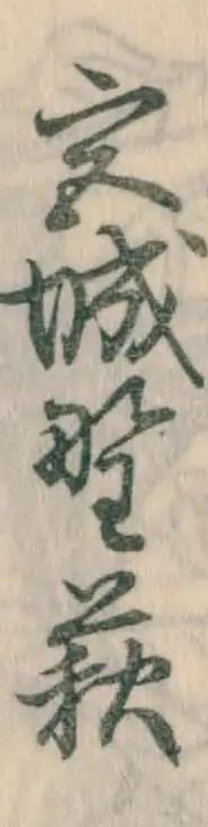宮城野萩

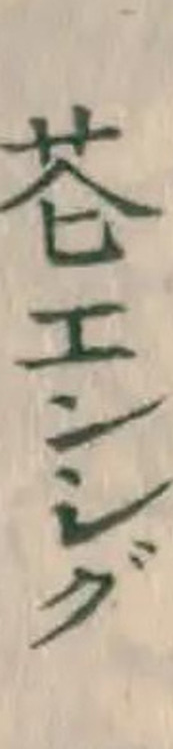花エンシグ
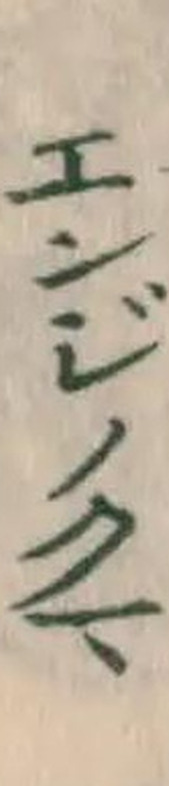エンジノクマ

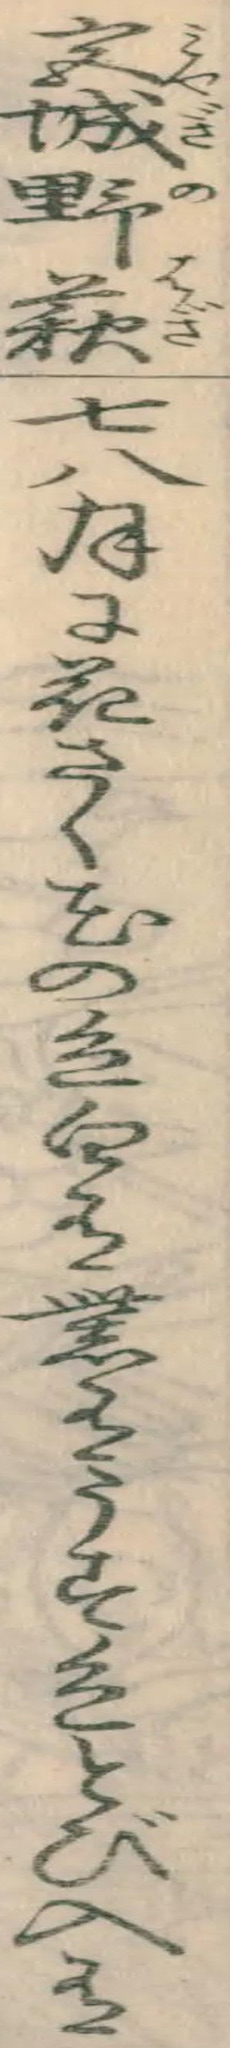[宮城野萩]七八月に花さく花の色白有紫有うす色とび入有
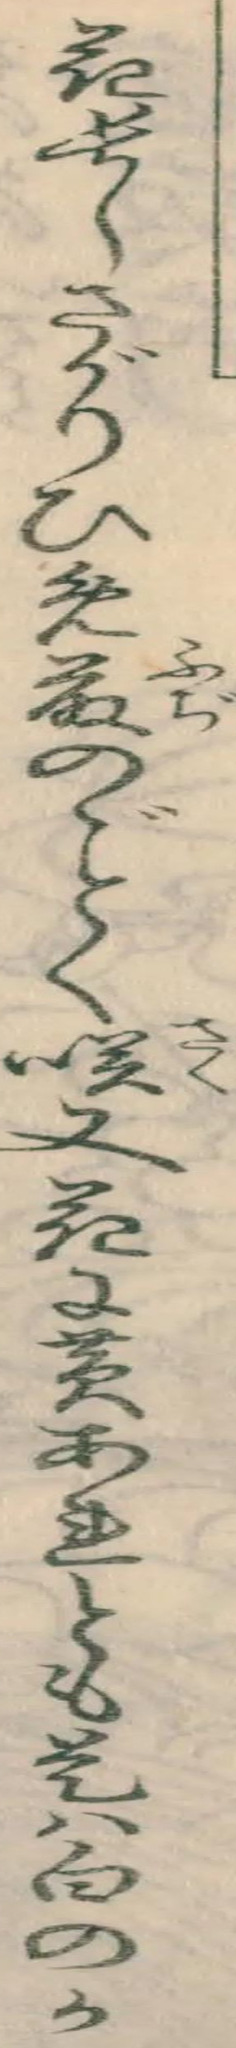花長しさがりひめ藤のごとく咲又花に黄あれとも是は白のか
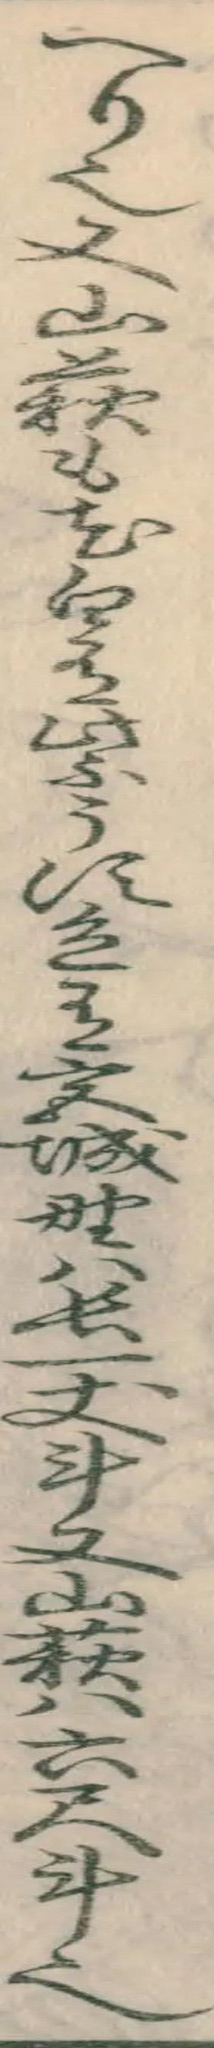へり也又山萩も花白有紫うす色有宮城野は長一丈斗又山萩は六尺斗也
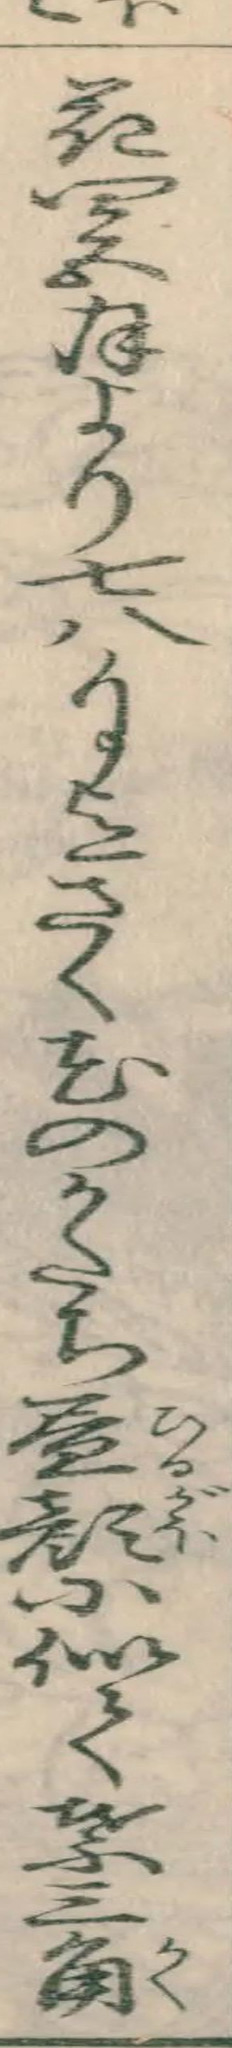花四五月より七八月迄さく花のかたち昼顔に似て葉三角
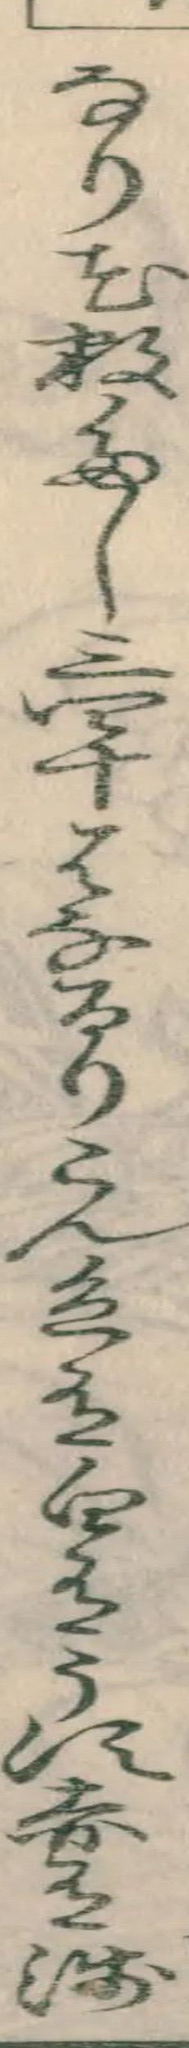なり花数多し三四十はなるりこん色有白有うす赤有浅
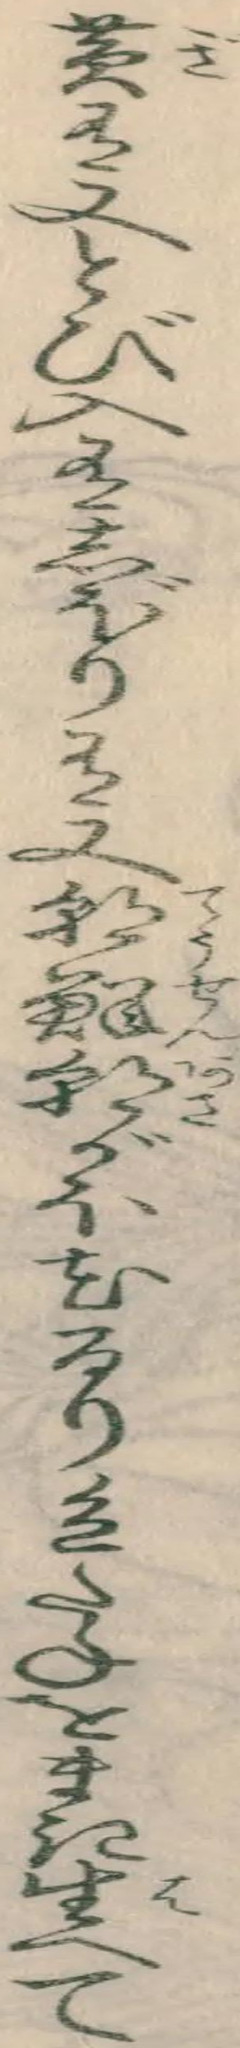黄有又とび入有しぼり有又朝鮮朝がほ花るり色たねをまき生へて
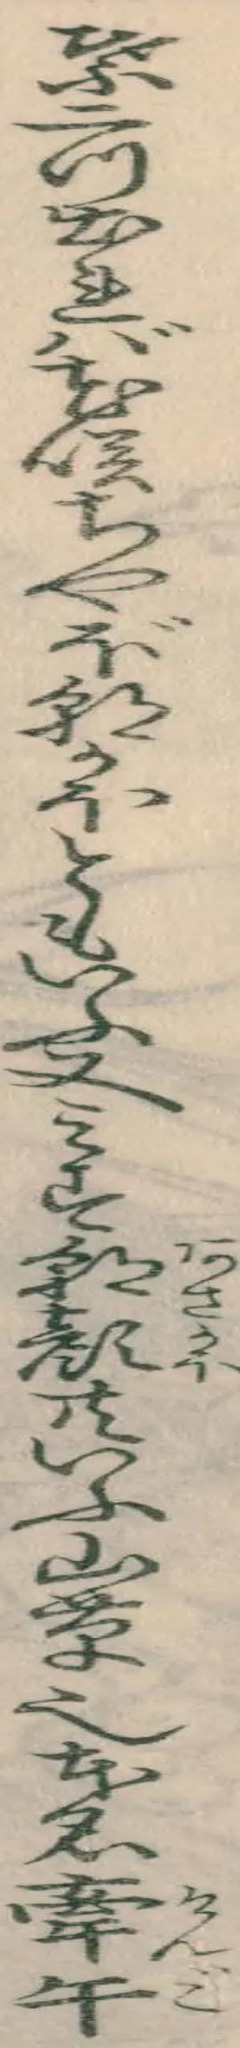葉二つ出れば花咲ちやぼ朝かほともいふ又みす朝顔共いふ山草也本名牽午
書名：畫本野山草. [4]
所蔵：国立国会図書館 National Diet Library, JAPAN
